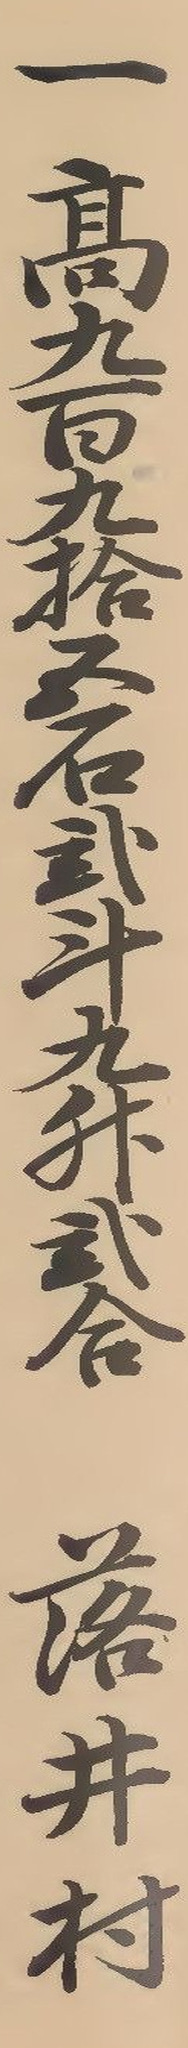一高九百九拾五石弐斗九升弐合落井村
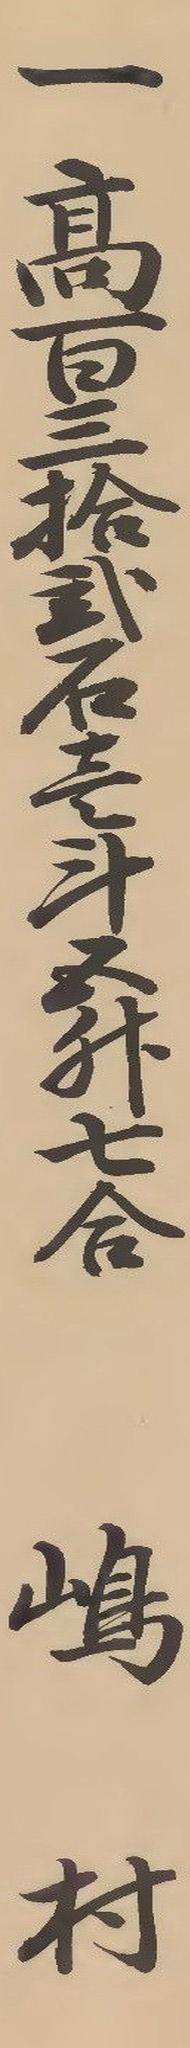一高百三拾弐石壱斗五升七合島村
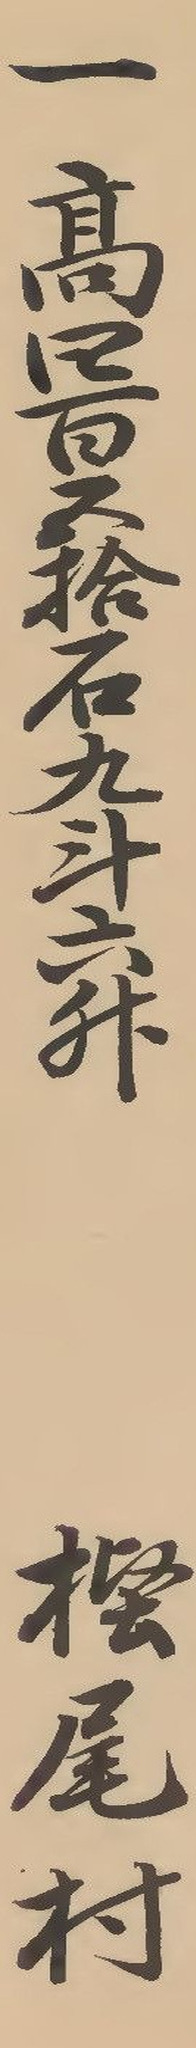一高四百五拾石九斗六升樫尾村
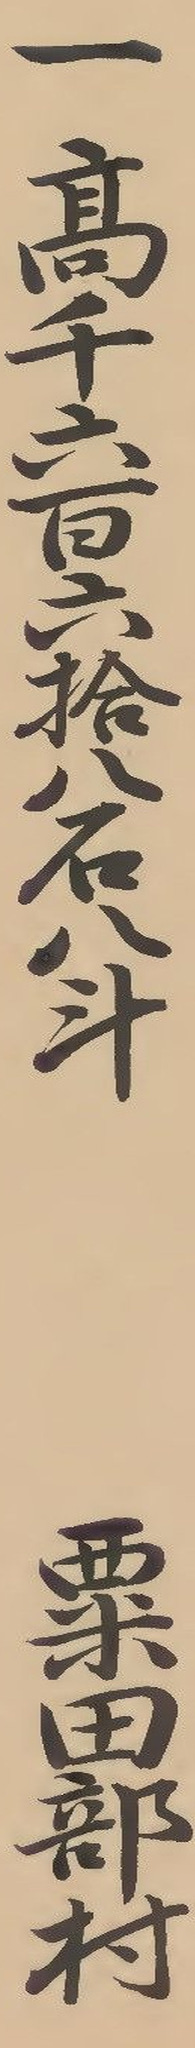一高千六百六拾八石八斗粟田部村

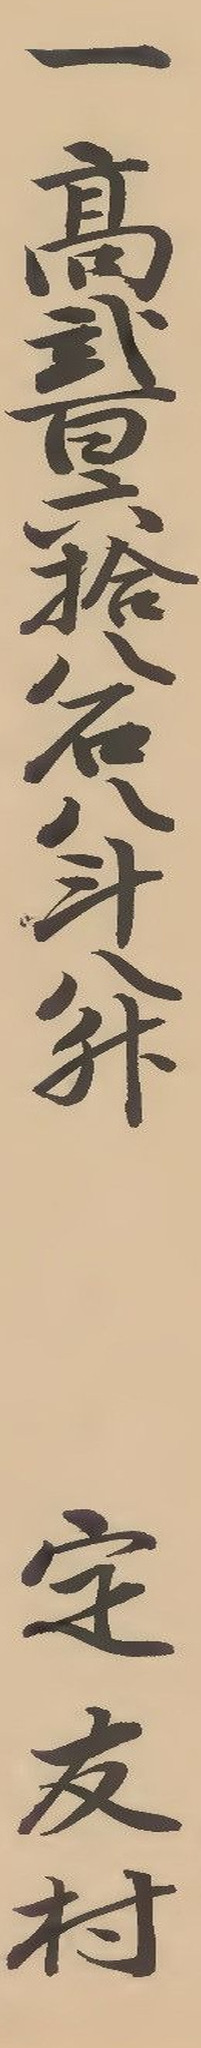一高弐百六拾八石八斗八升定友村
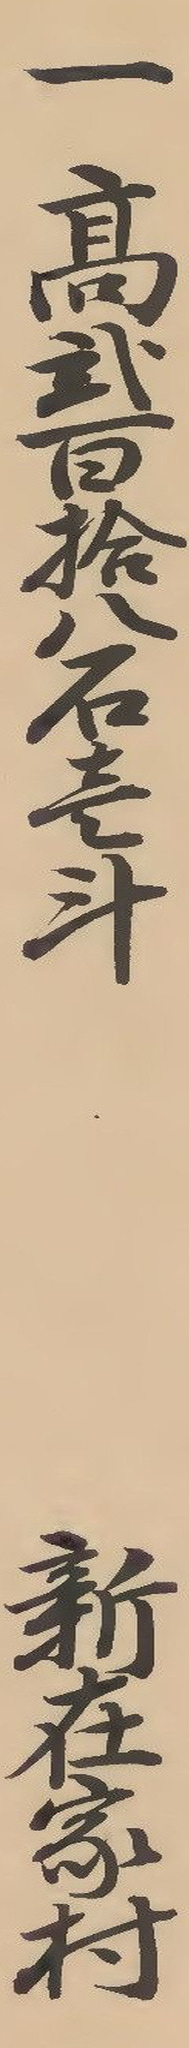一高弐百拾八石壱斗新在家村
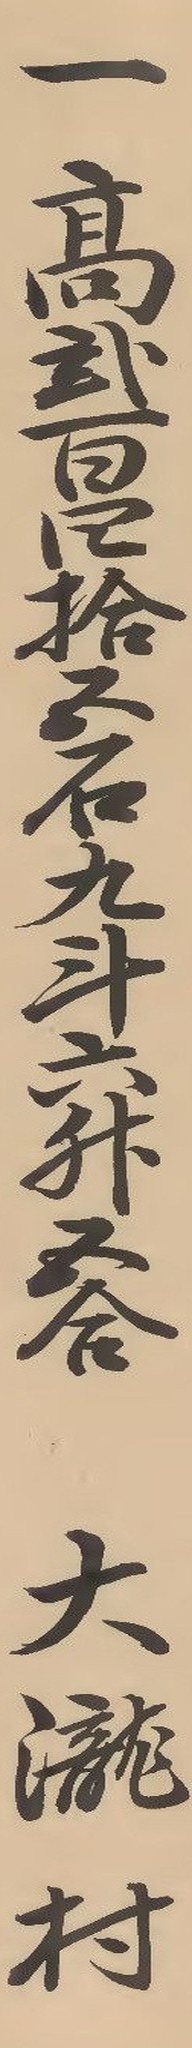一高弐百四拾五石九斗六升五合大滝村
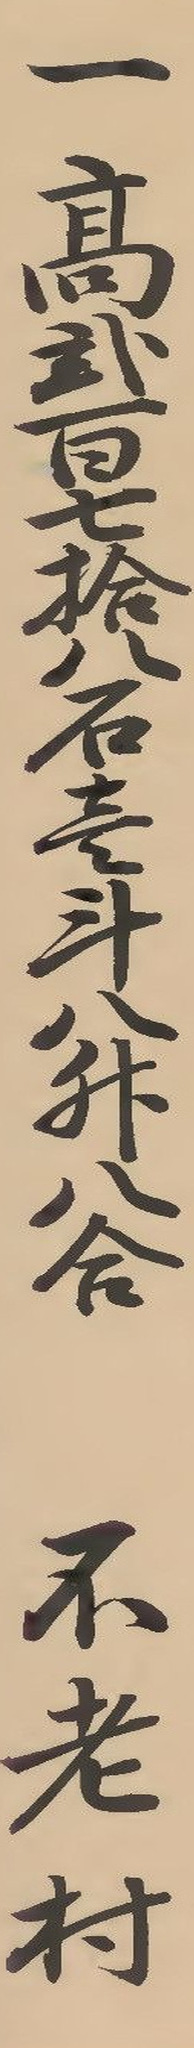一高弐百七拾八石壱斗八升八合不老村
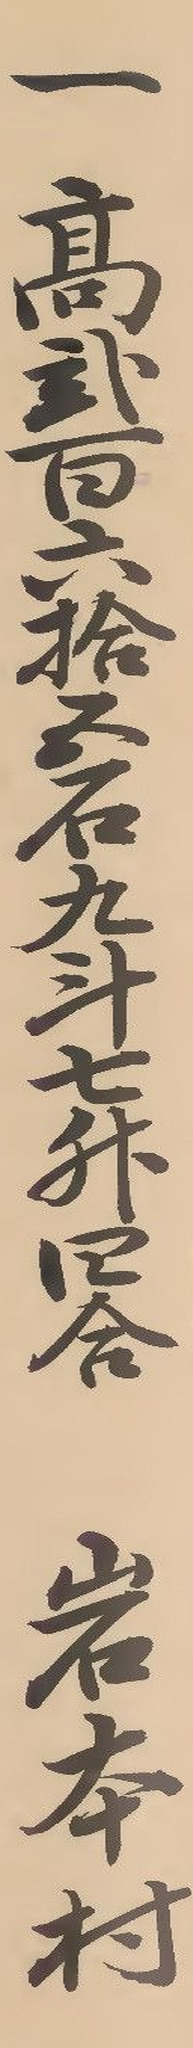一高弐百六拾五石九斗七升四合岩本村
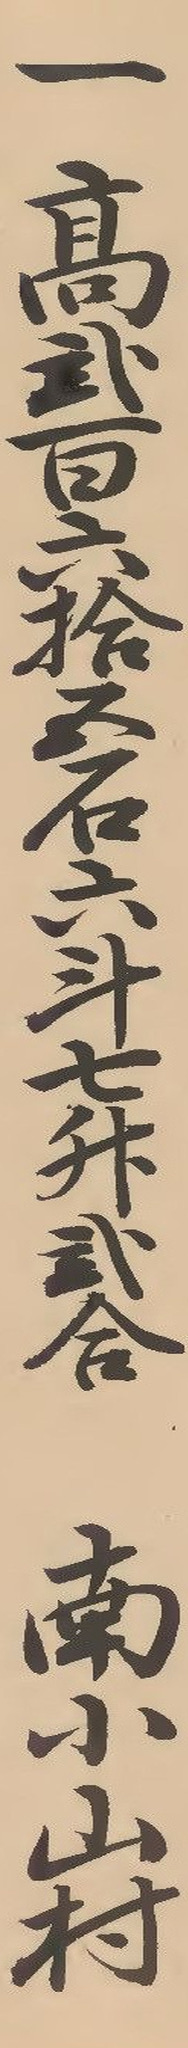一高弐百六拾五石六斗七升弐合南小山村
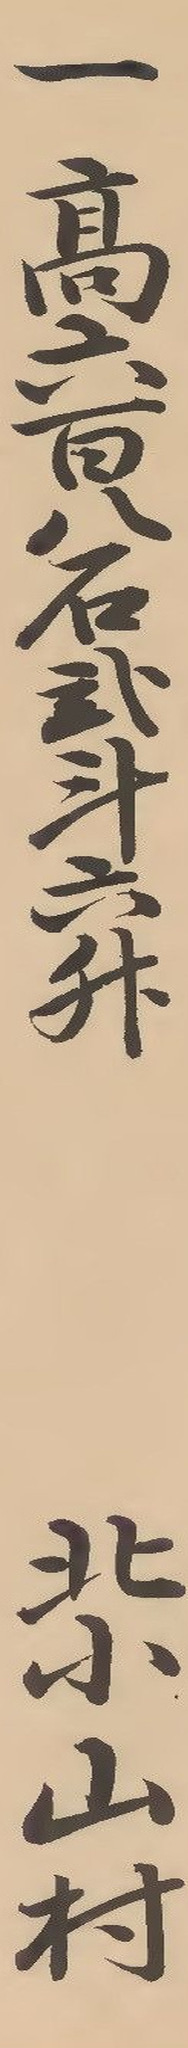一高六百八石弐斗六升北小山村
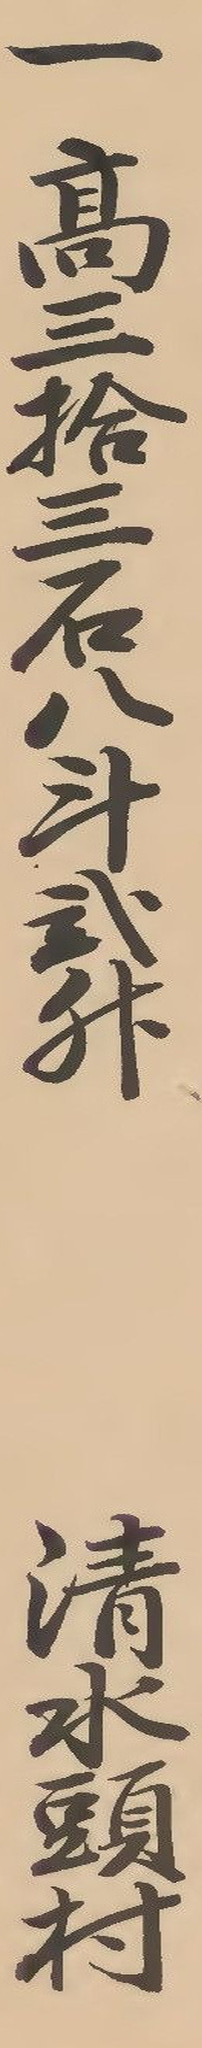一高三拾三石八斗弐升清水頭村

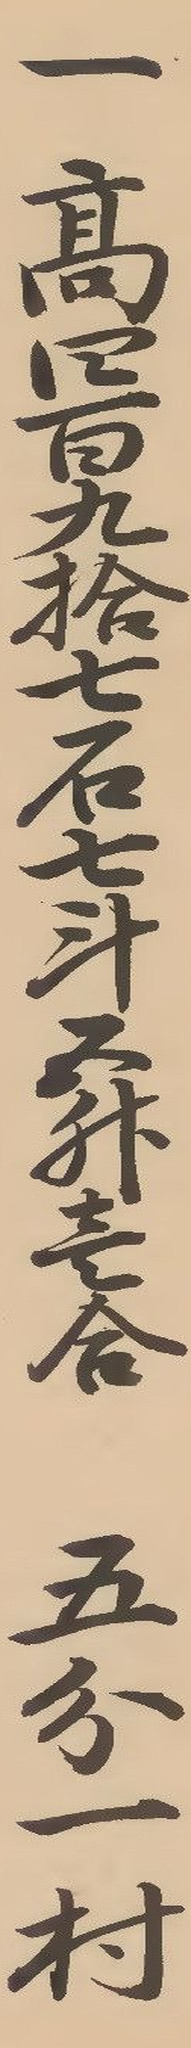一高四百九拾七石七斗五升壱合五分一村
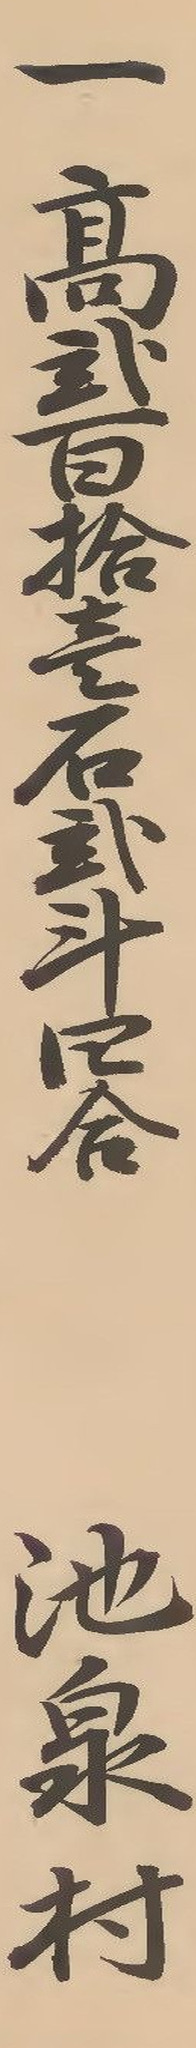一高弐百拾壱石弐斗四合池泉村
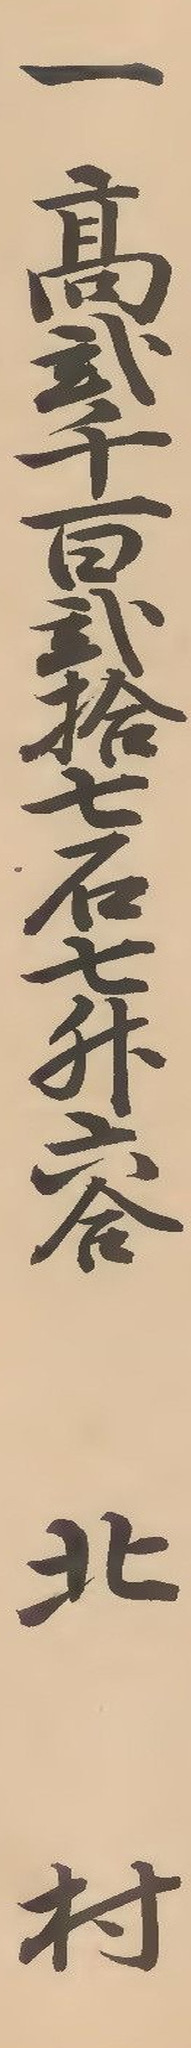一高弐千百弐拾七石七升六合北村
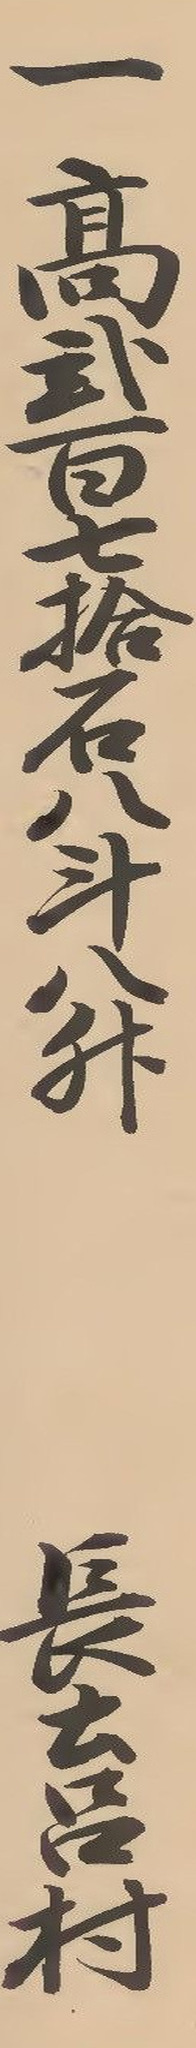一高弐百七拾石八斗八升長土呂村
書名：越前国郷帳
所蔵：国立公文書館 National Archives of Japan
